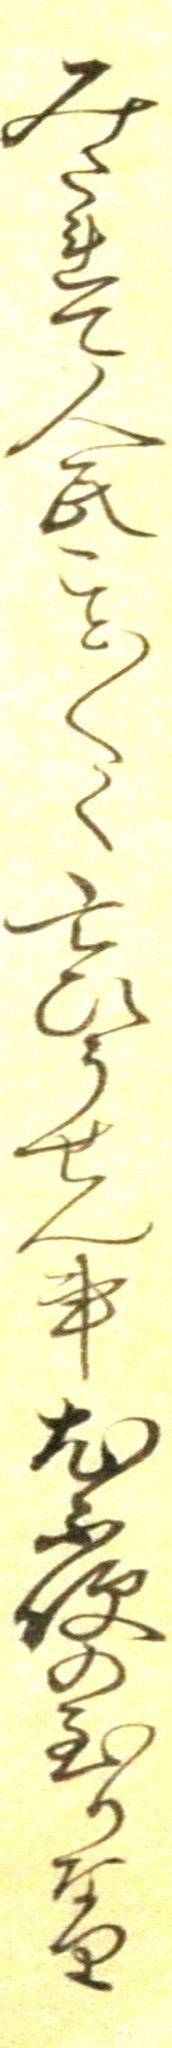みたれて人民こと〳〵く亡ひうせん事尤不便の至りなり
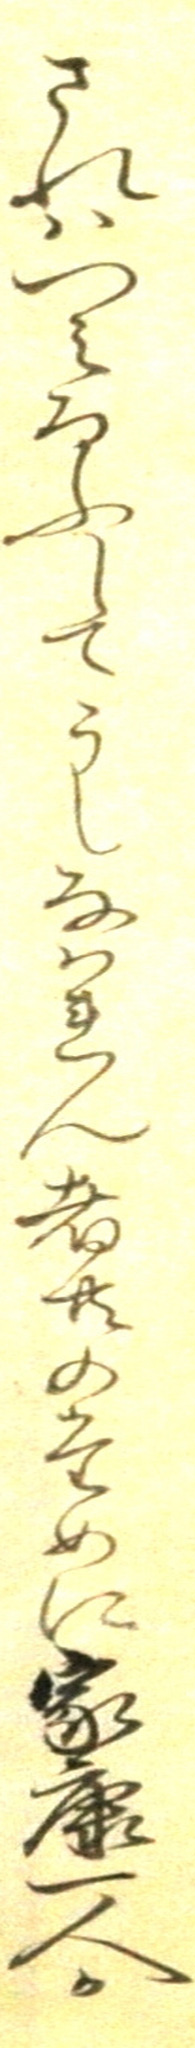されはつみなふしてうしなはれん者共のために家康一人か
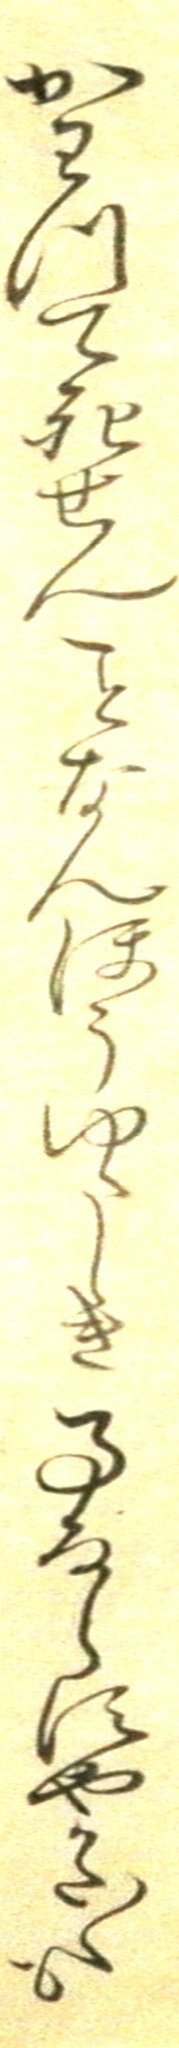かわつて死せんことなんほうゆゝしき事ならすやかた〳〵も
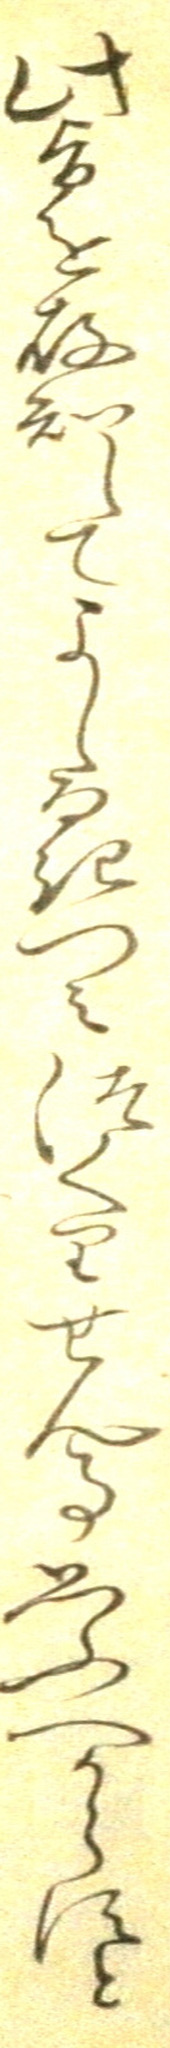此旨を存知してよしなきつみつくりせん事思ふへからすと
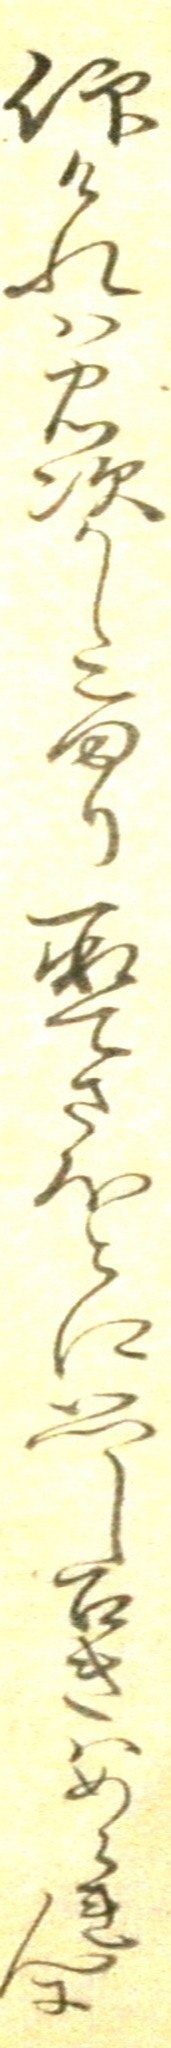仰けれは忠次かしこまり取てさほとに思し召きはめられんに
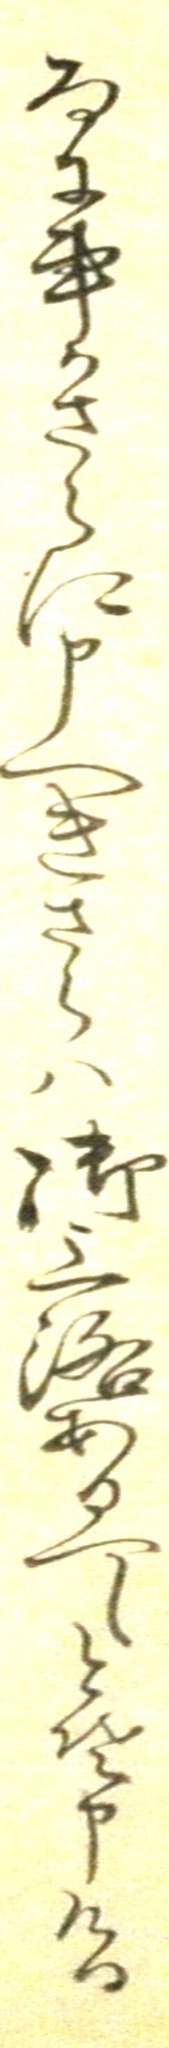なに事かさらに申へきさらは御上洛あるへしとそ申ける
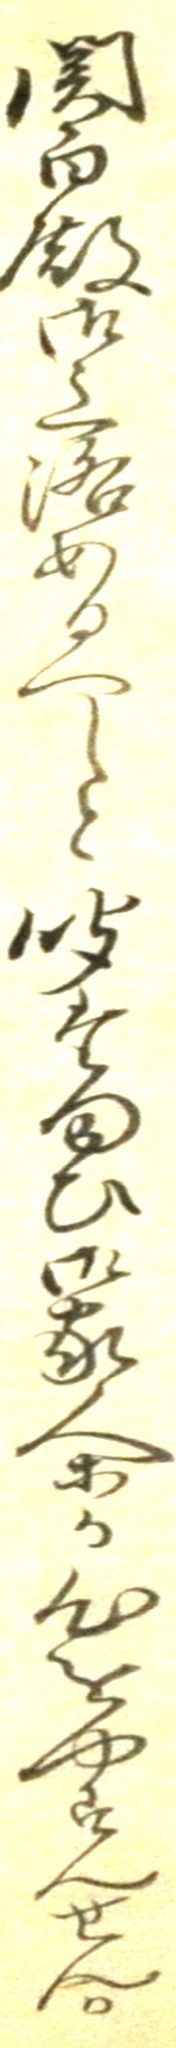関白殿御上洛あるへしと聞たまひ御家人等か心をやすんせんか
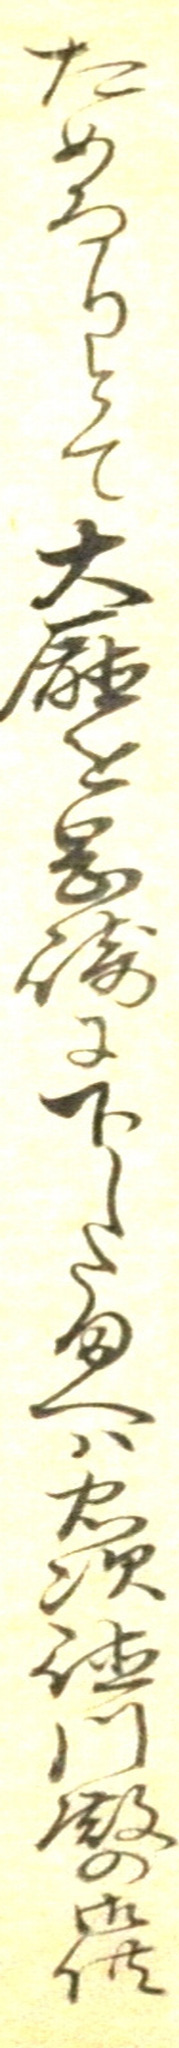ためなりとて大庁を岡崎に下したまへは忠次徳川殿の御供
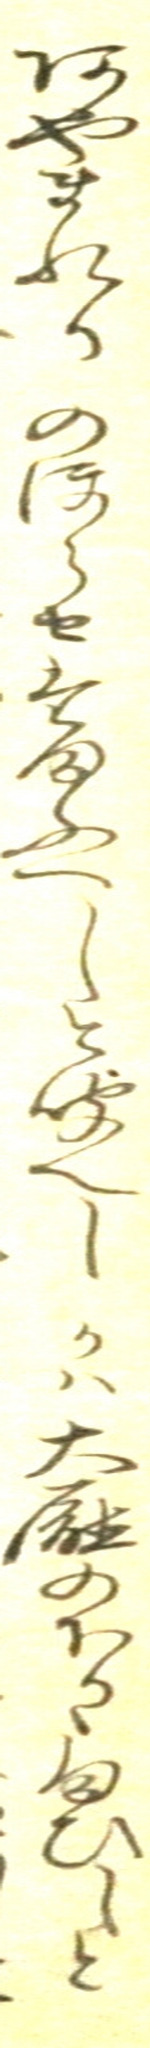あやまれりのほらせたまふへしと聞へしかは大庁の下りたまひしと
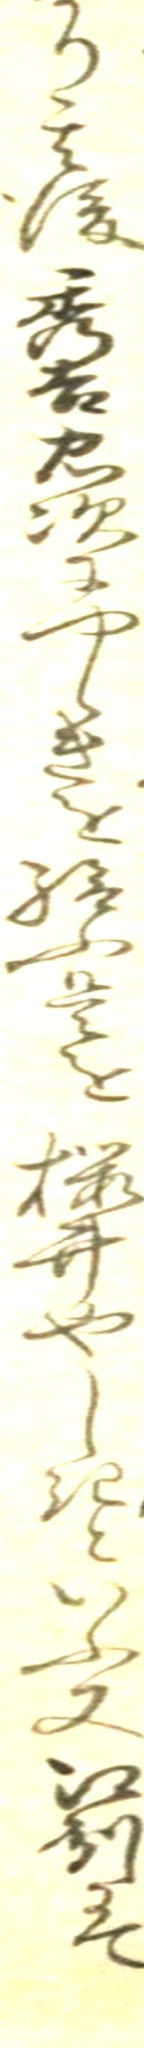なり其後秀吉忠次にやしきを給ふ是を桜井やしきといふ又江州にて
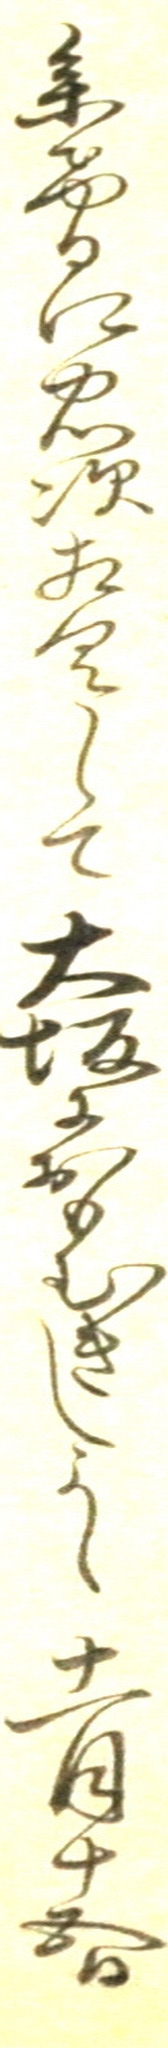参けるに忠次相具して大坂におもむきしよし十一月十五日
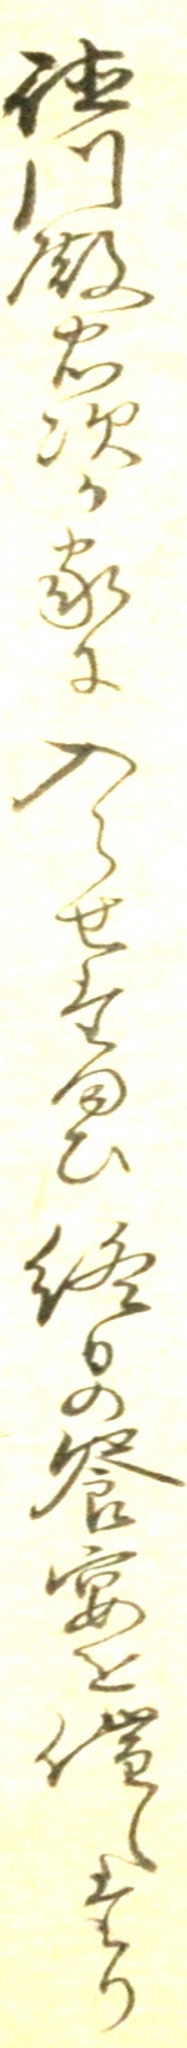徳川殿忠次か家に入らせたまひ終日の饗宴を催したり
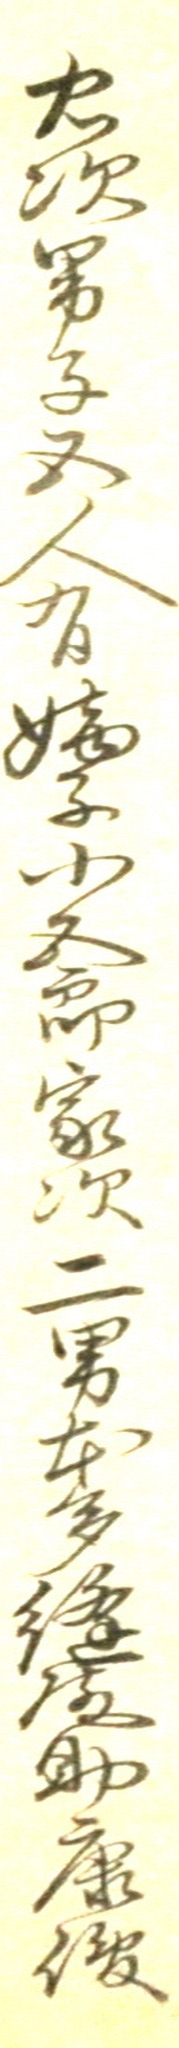忠次男子五人有嫡子小五郎家次二男本多縫殿助康俊
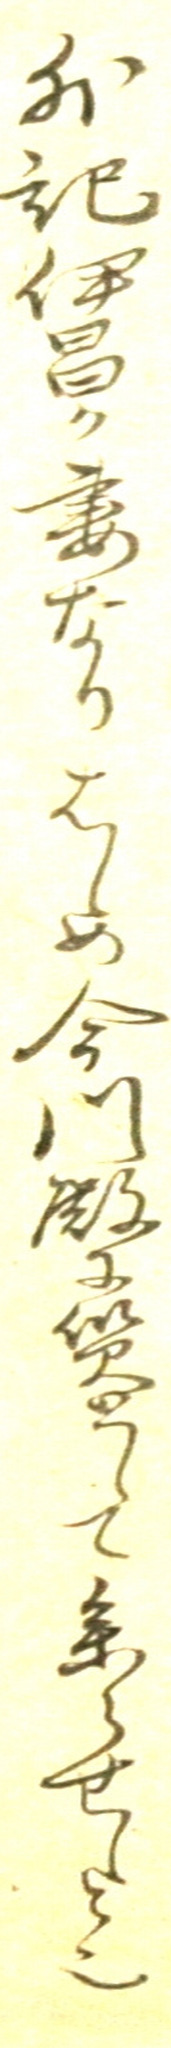外記伊昌か妻なりはしめ今川殿に質として参らせしと也
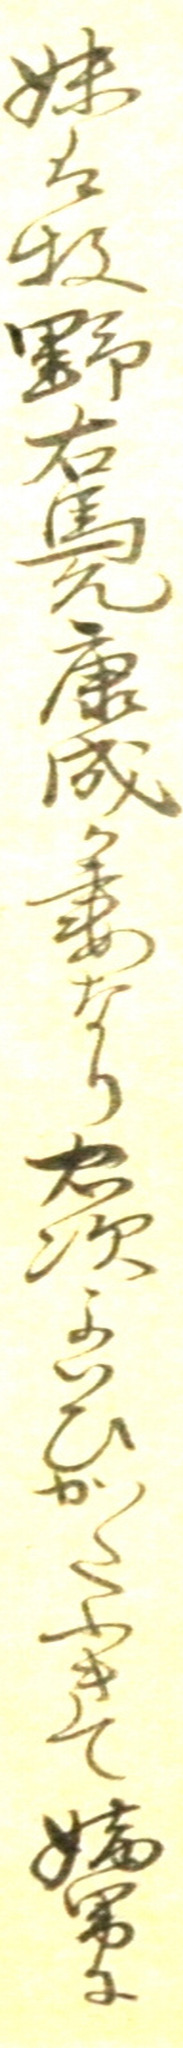妹は牧野右馬允康成か妻なり忠次よはひかたふきて嫡男に
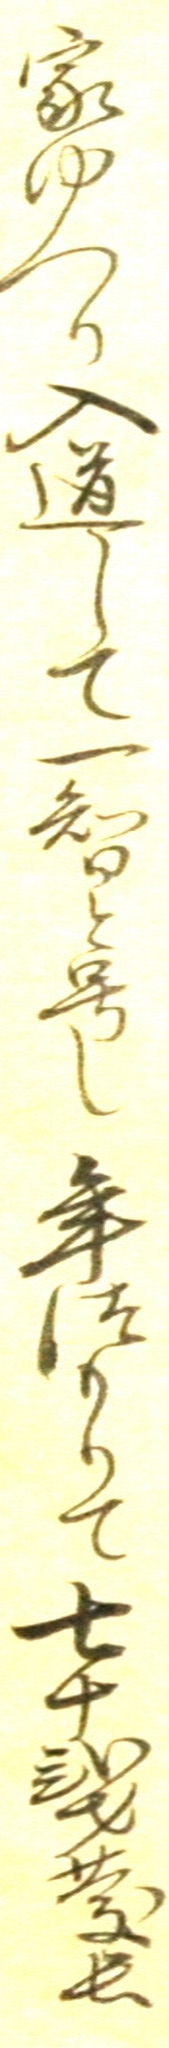家ゆつり入道して一智と号し年つもりて七十二才慶長
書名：藩翰譜（四・上）
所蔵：伊那市立高遠町図書館・合同会社AMANE
